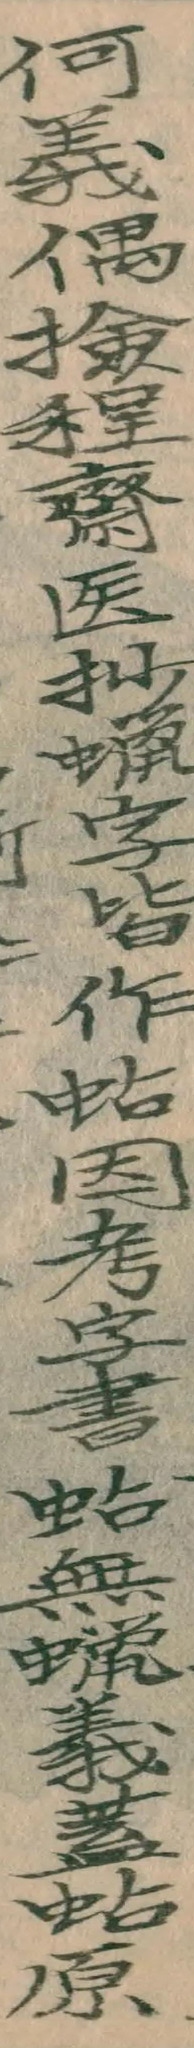何義偶撿程齋医抄蠟字皆作蛅因考字書蛅無蠟義蓋蛅原
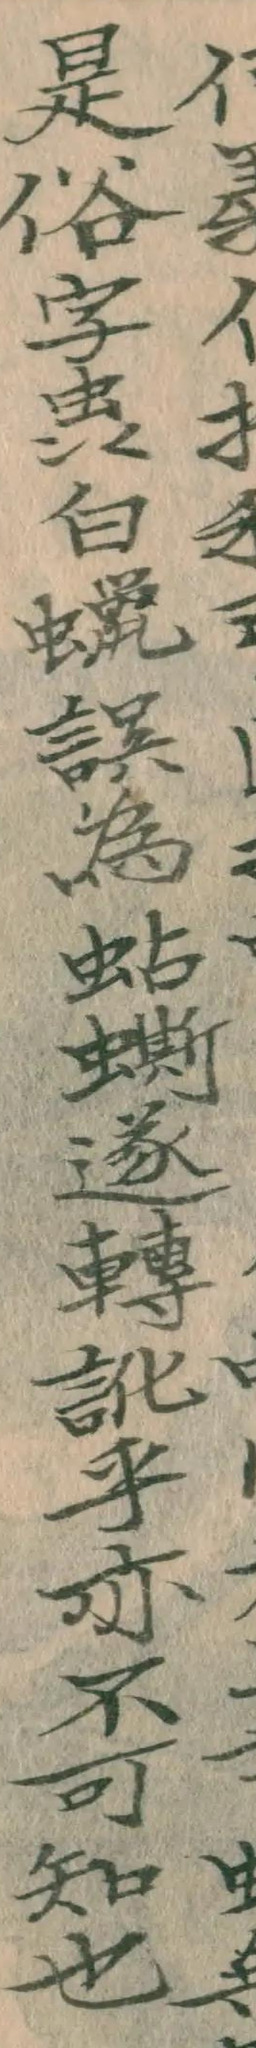是俗字蟲白蠟誤為蛅蟖遂轉訛乎亦不可知也

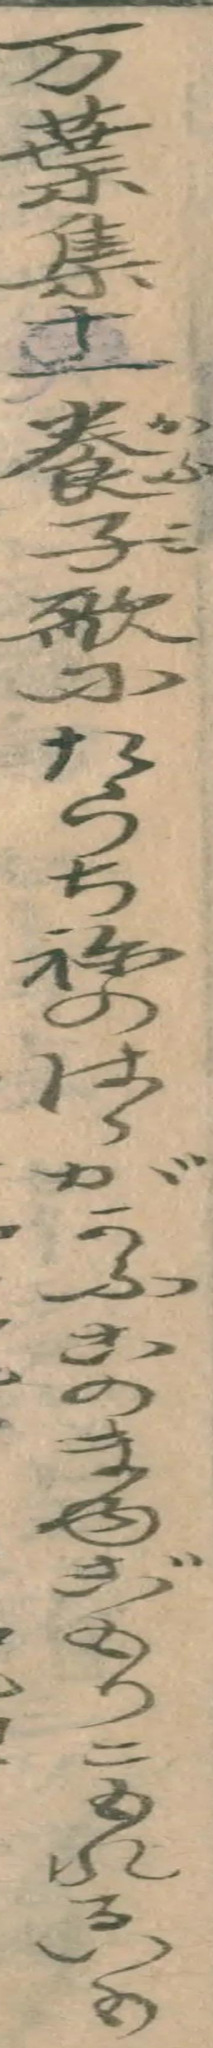万葉集十二養子歌にたらちねのはゝがかふこのまゆごもりこもれるいも

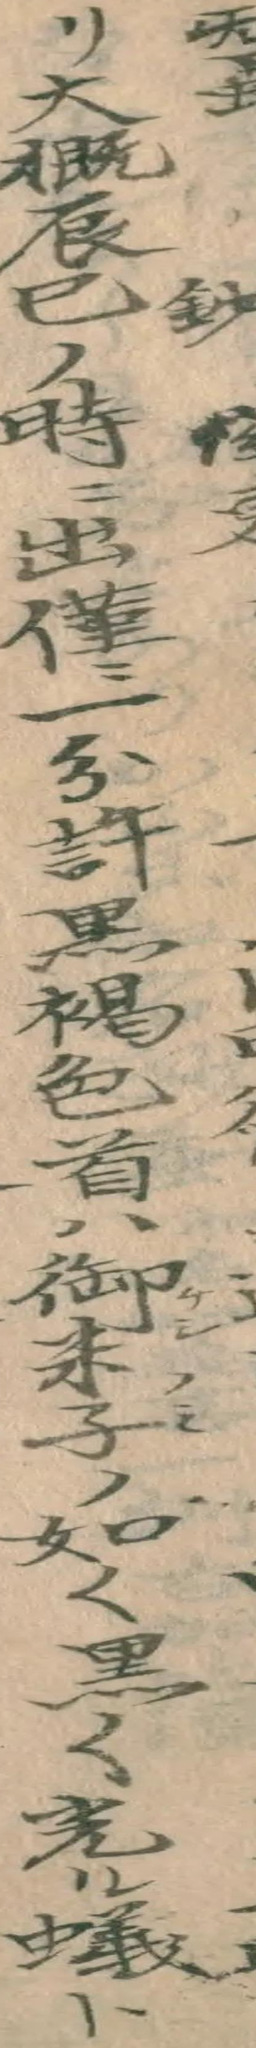リ大概辰巳ノ時ニ出僅ニ一分許黒褐色首ハ御米子ノ如く黒く光ル蟻ト
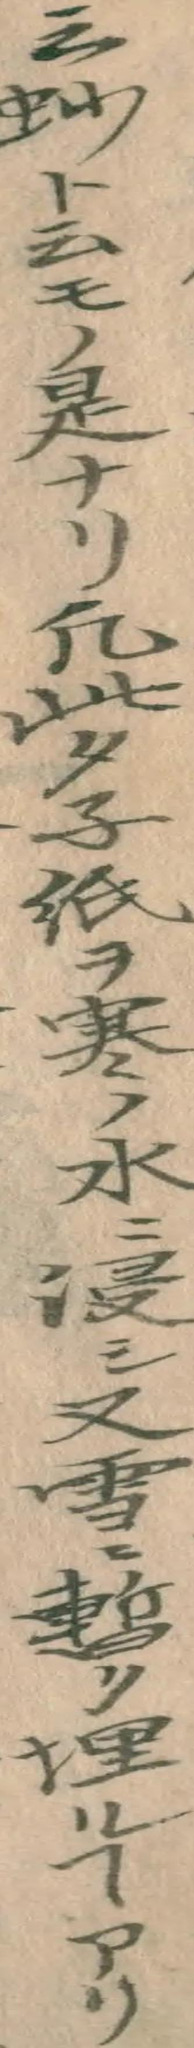云䖢ト云モノ是ナリ凡此タネ紙ヲ寒ノ水ニ浸シ又雪ニ暫ク埋ルコトアリ
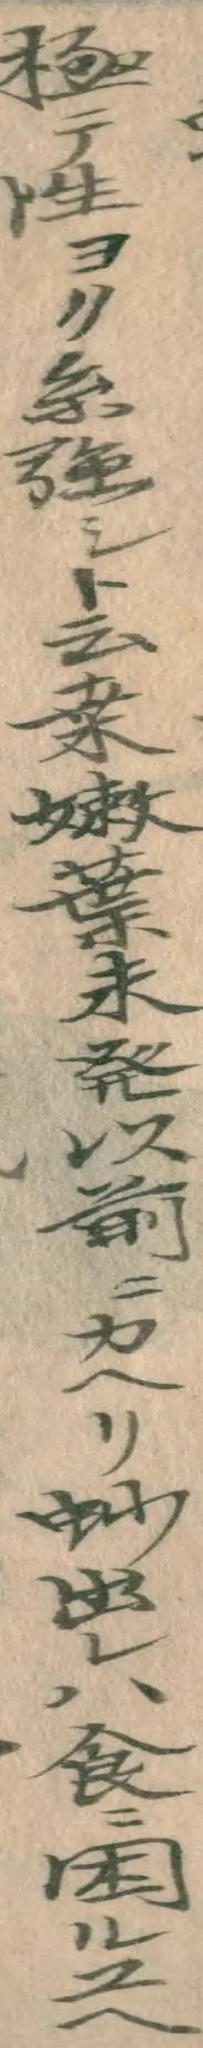極テ性ヨク糸強シト云桒嫩葉未発以前ニカヘリ䖢出レハ食ニ困ルユヘ
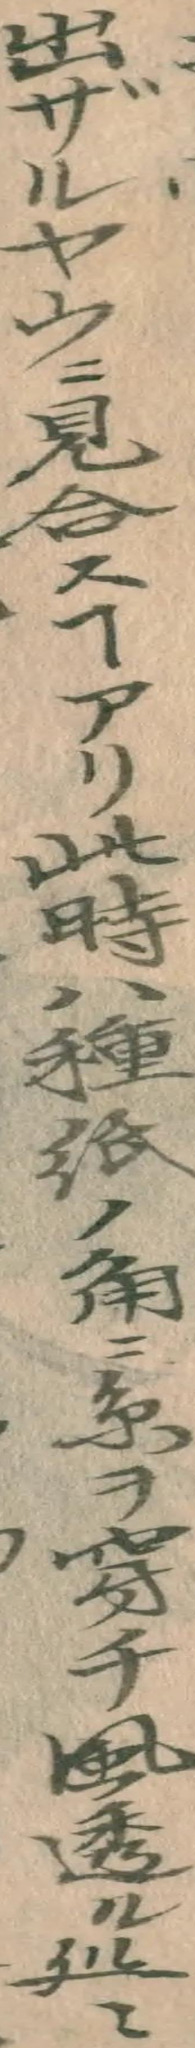出ザルヤウニ見合スコトアリ此時ハ種紙ノ角ニ糸ヲ穿チ風透ル処ニ
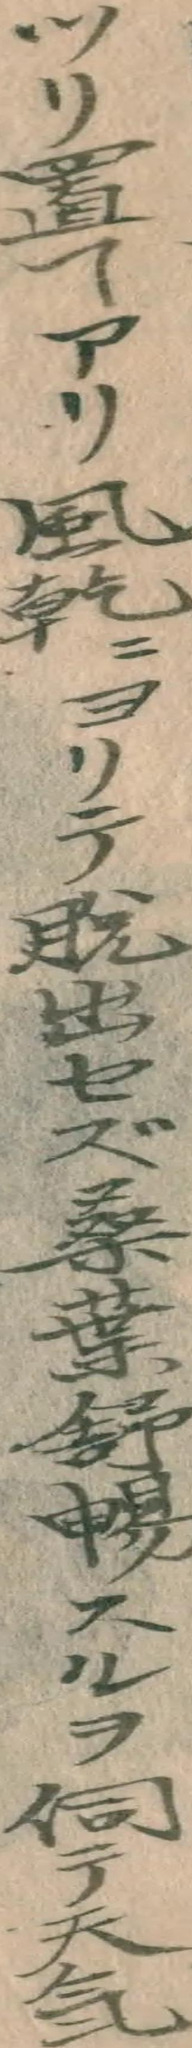ツリ置コトアリ風乾ニヨリテ脱出セズ桑葉舒暢スルヲ伺テ天気
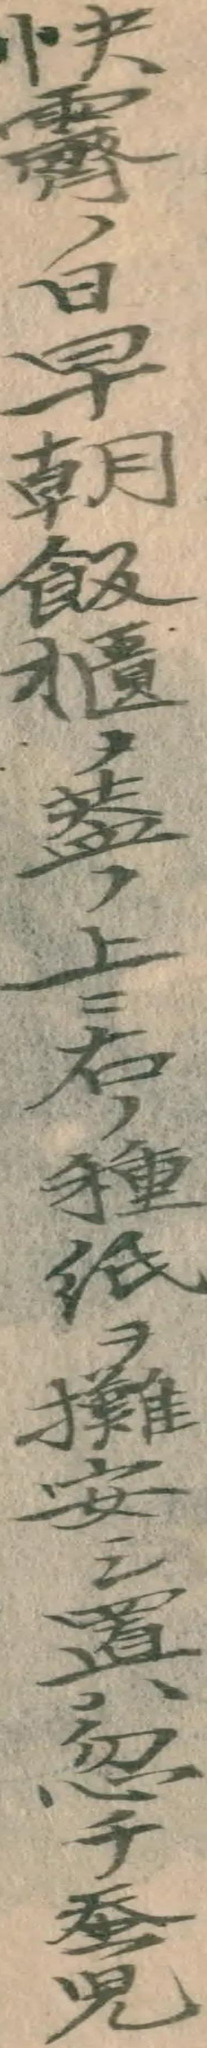快霽ノ日早朝飯櫃ノ葢ノ上ニ右ノ種紙ヲ攤安シ置ハ忽チ蚕児
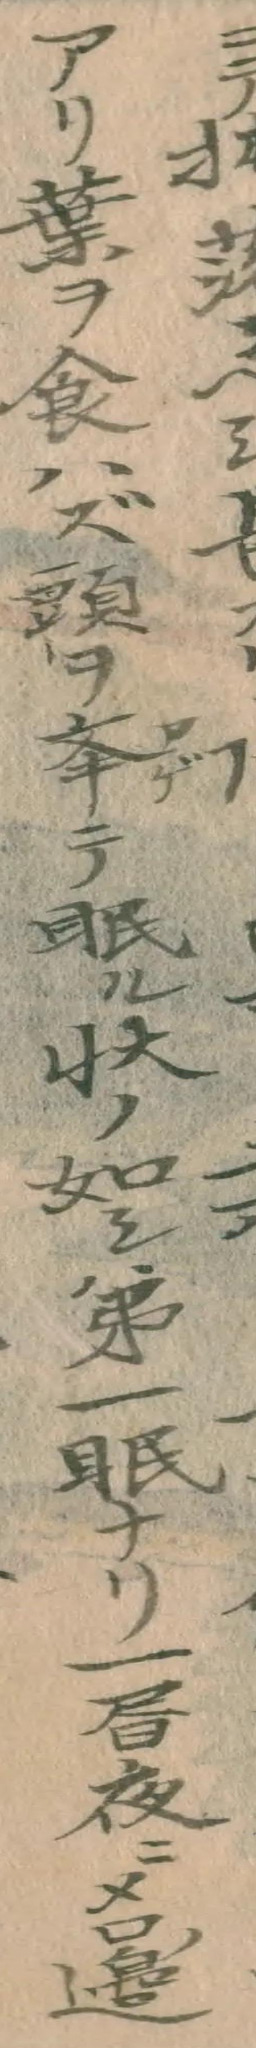アリ葉ヲ食ハズ頭ヲ挙テ眠ル状ノ如シ第一眠ナリ一昼夜ニシテ口邉
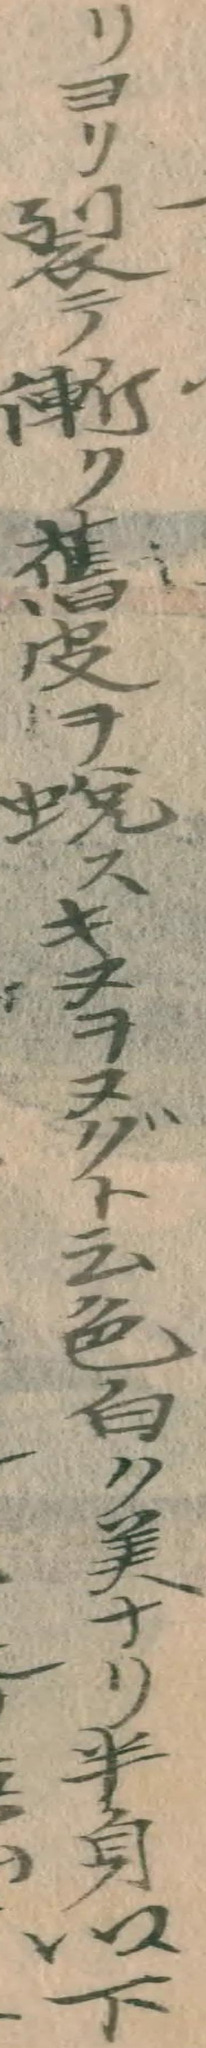リヨリ裂テ漸ク舊皮ヲ蛻スキヌヲヌグト云色白ク美ナリ半身以下
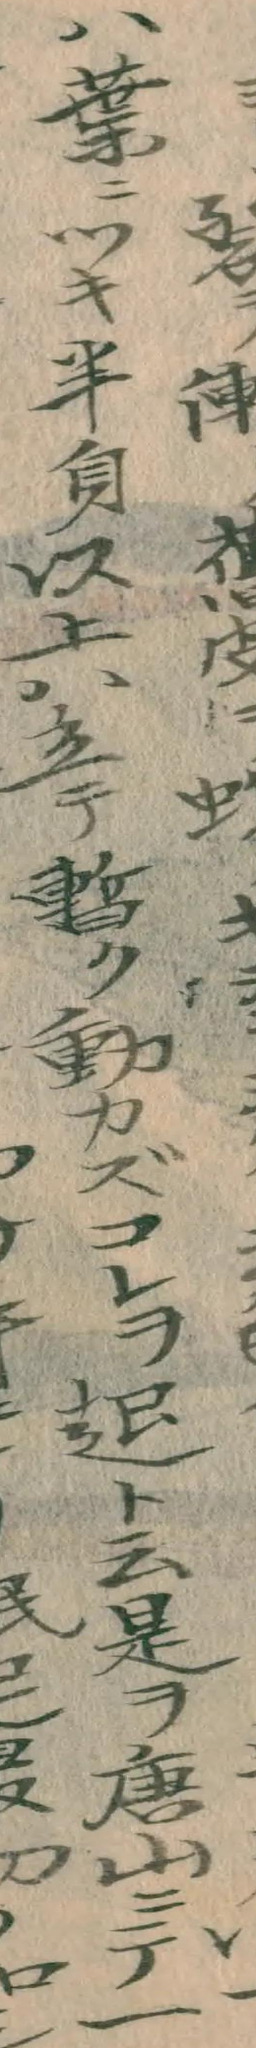ハ葉ニツキ半身以上ハ立テ暫ク動カズコレヲ起ト云是ヲ唐山ニテ一
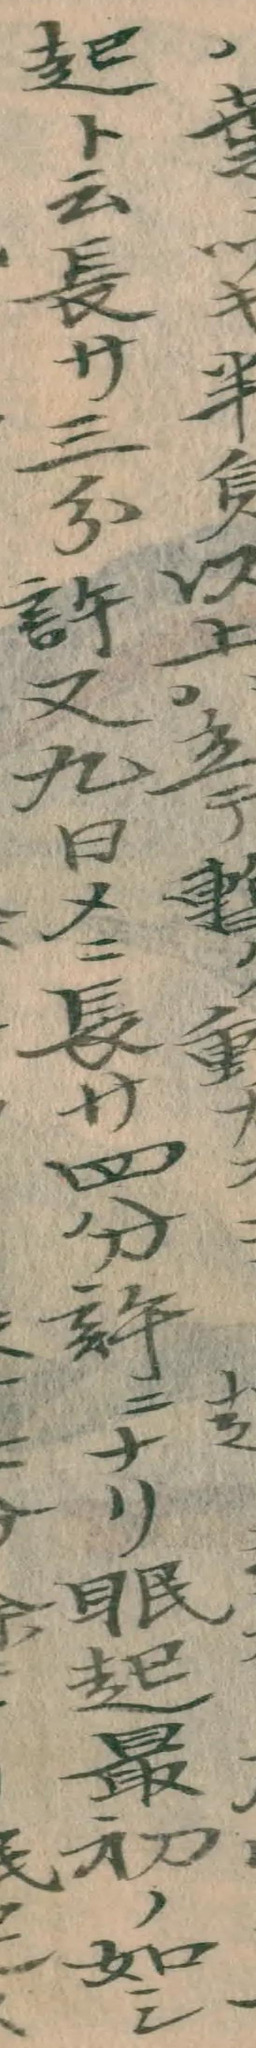起ト云長サ三分許又九日メニ長サ四分許ニナリ眠起最初ノ如シ
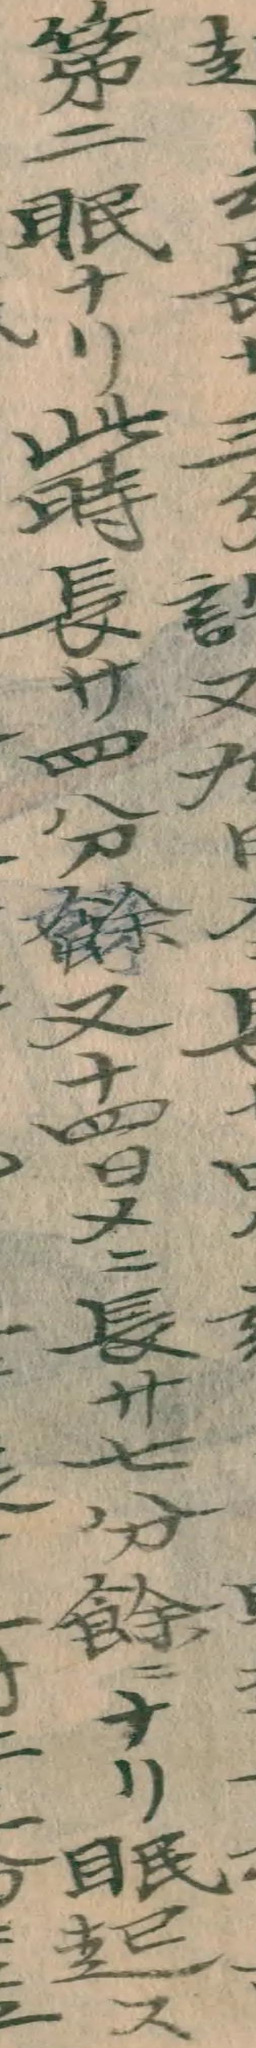第二眠ナリ此時長サ四分餘又十四日メニ長七分餘ニナリ眠起ス
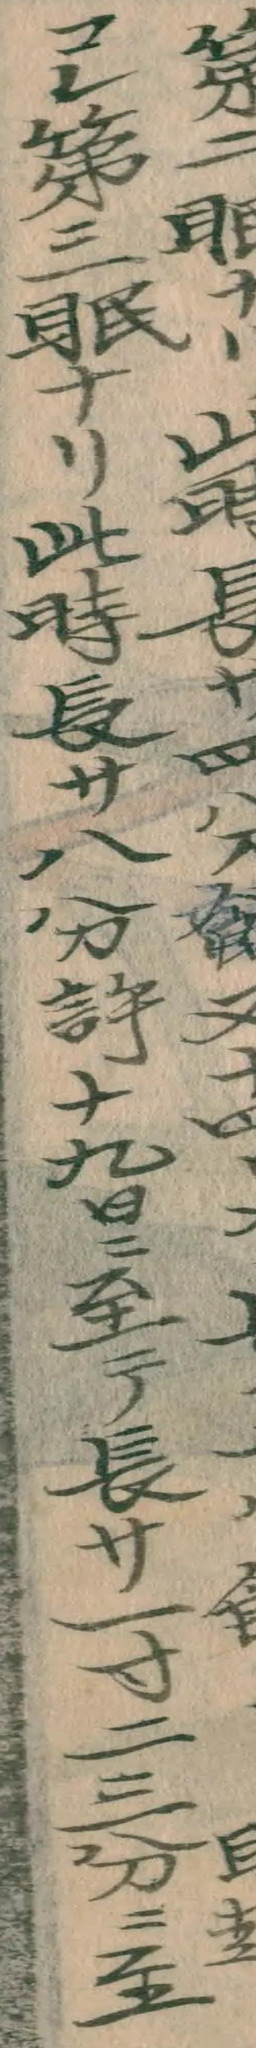コレ第三眠ナリ此時長サ八分許十九日ニ至テ長サ一寸二三分ニ至
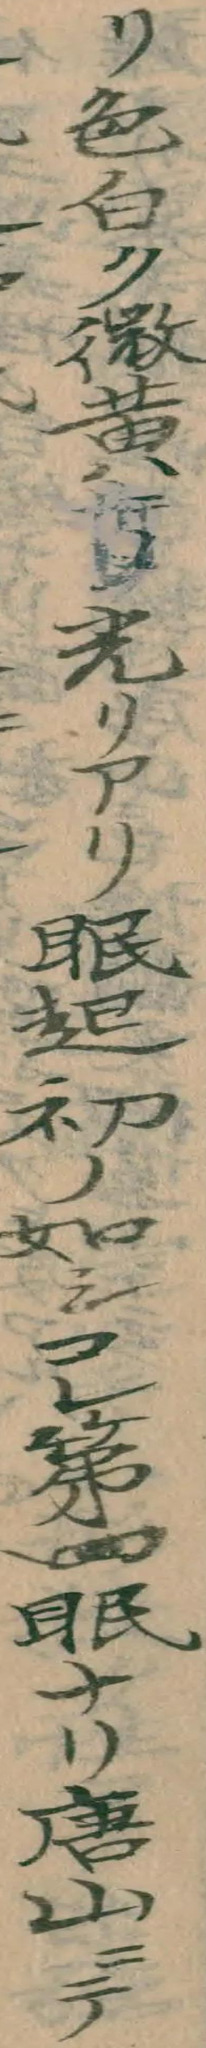リ色白ク微黄ニシテ光リアリ眠起初ノ如シコレ第四眠ナリ唐山ニテ
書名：千蟲譜 3巻. [1]
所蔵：国立国会図書館 National Diet Library, JAPAN
